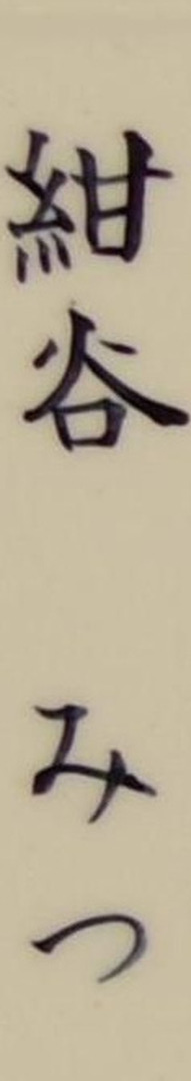紺谷みつ
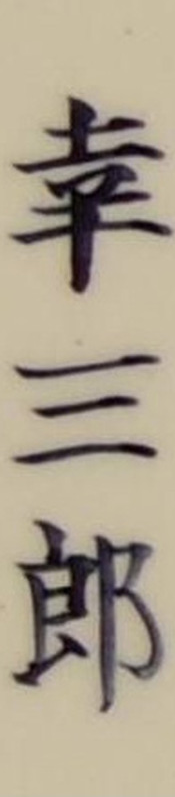幸三郎
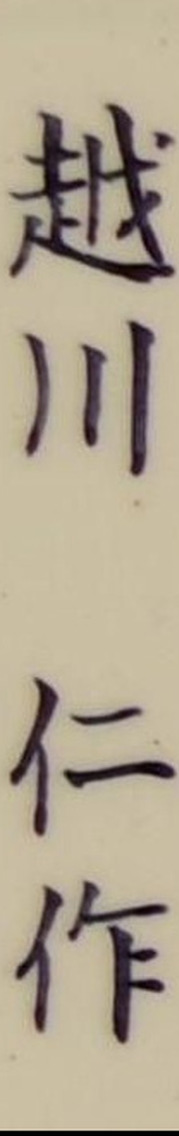越川仁作
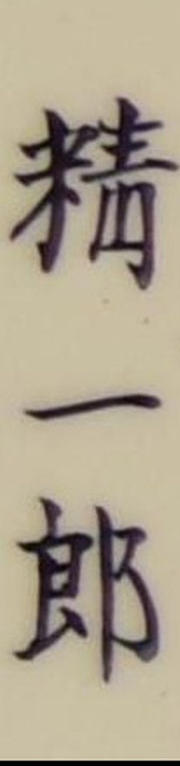精一郎
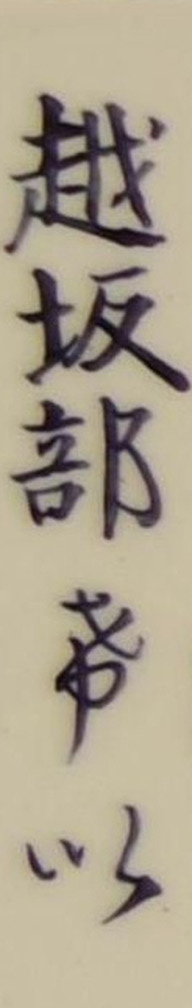越坂部けい

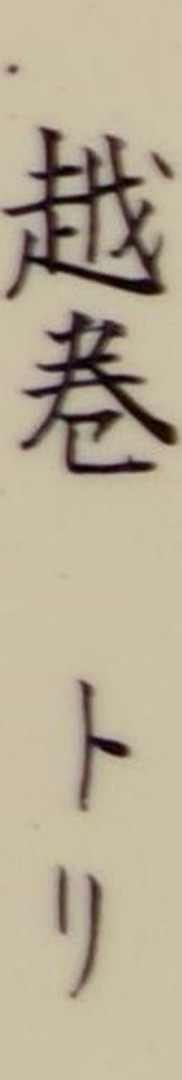越巻トリ
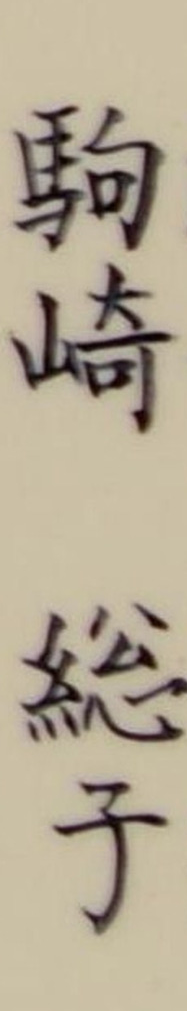駒崎総子
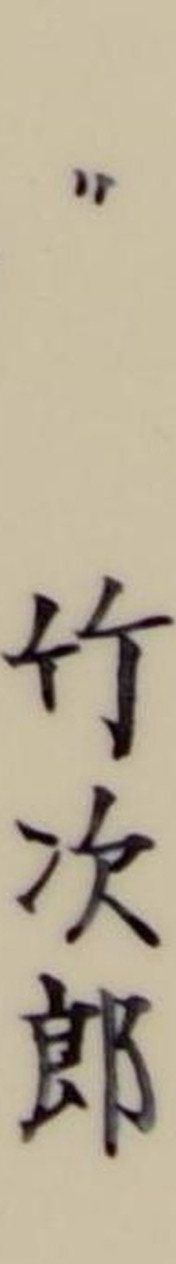竹次郎
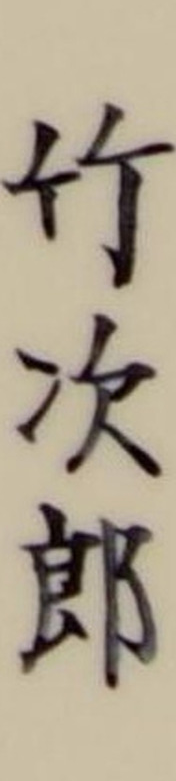竹次郎
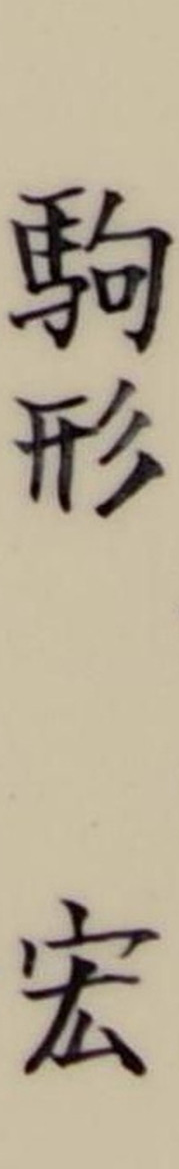駒形宏
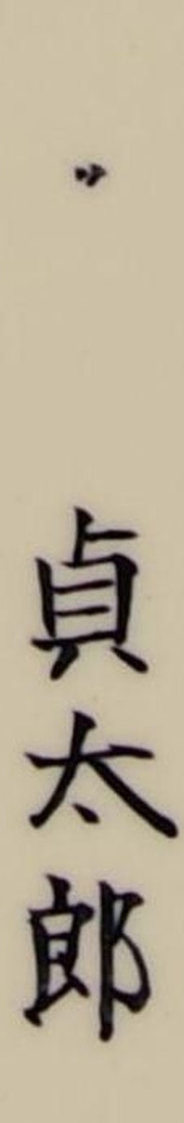貞太郎
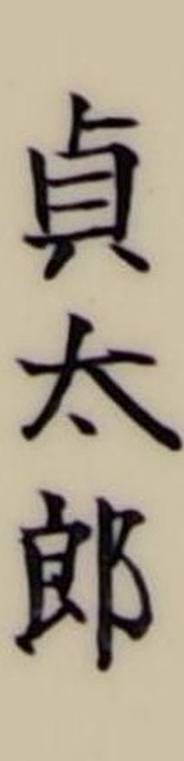貞太郎
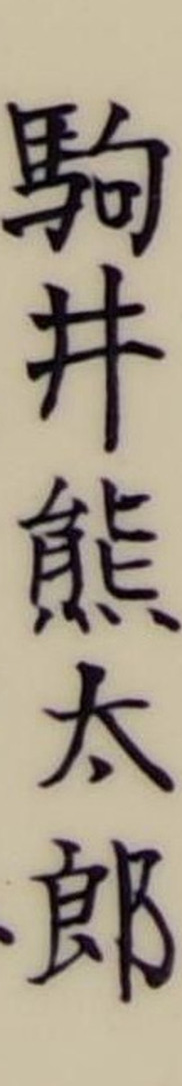駒井熊太郎
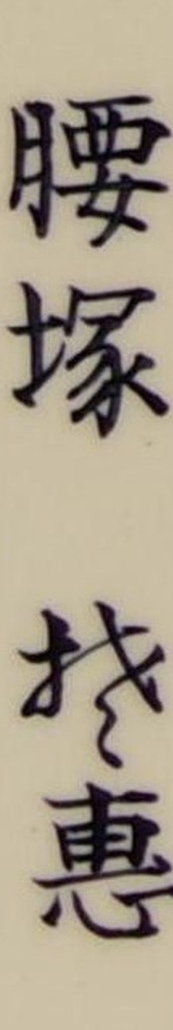腰塚そえ
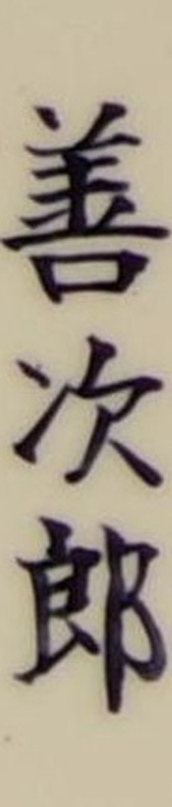善次郎
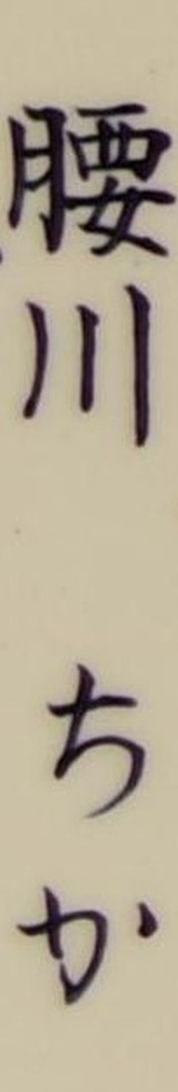腰川ちか
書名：E~L
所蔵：高野山金剛峯寺
